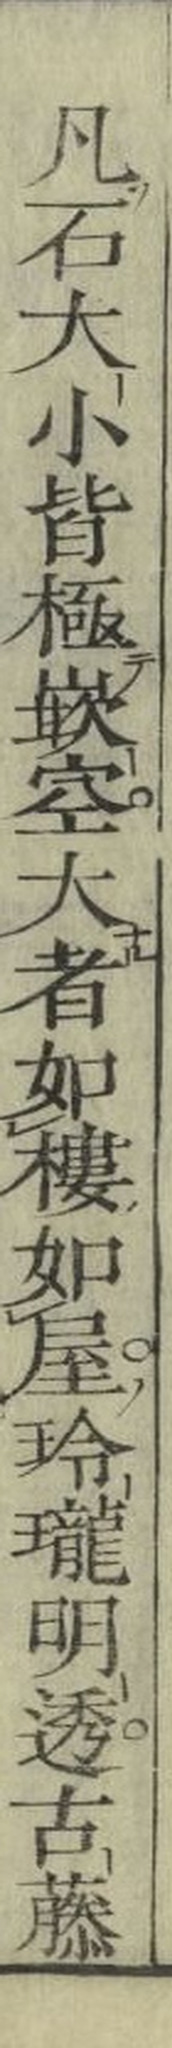凡石大-小皆極嵌-空。大者如楼如屋。玲-瓏明-透。古-藤
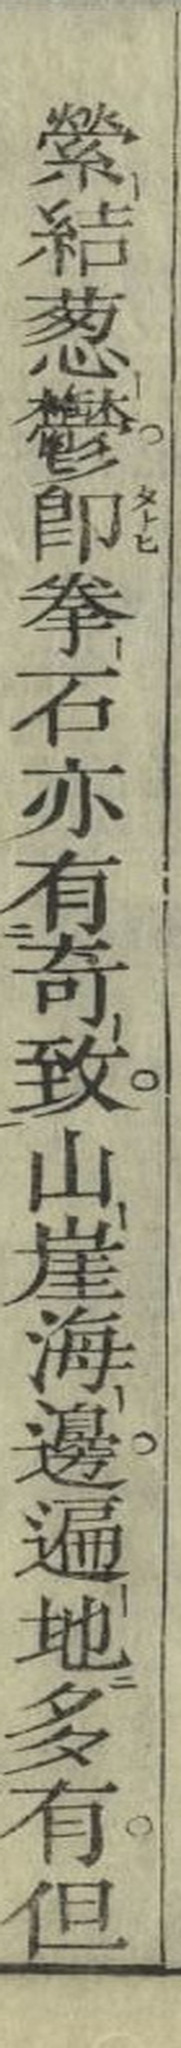縈-結葱-鬱。即拳-石亦有奇-致。山-崖海-辺。遍-地多-有。但

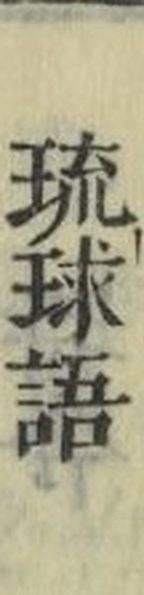琉-球語
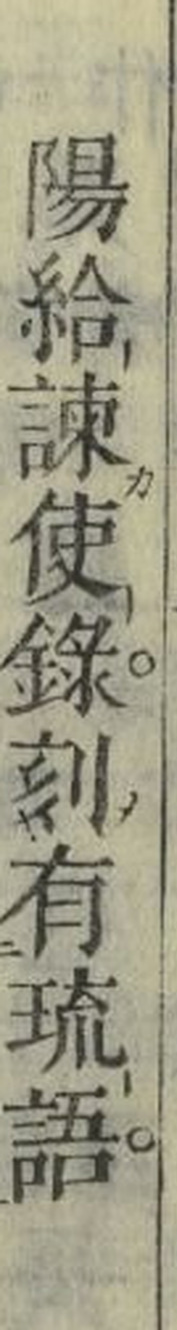陽給-諫使-録。刻有琉-語。

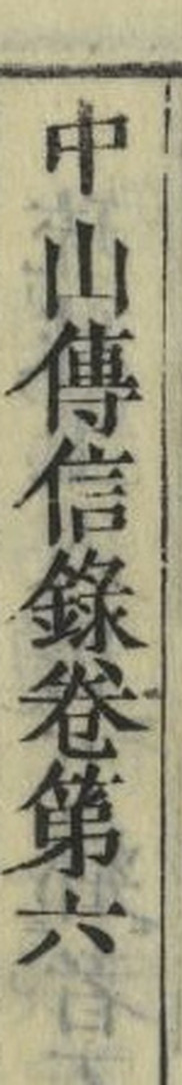中山伝信録巻第六
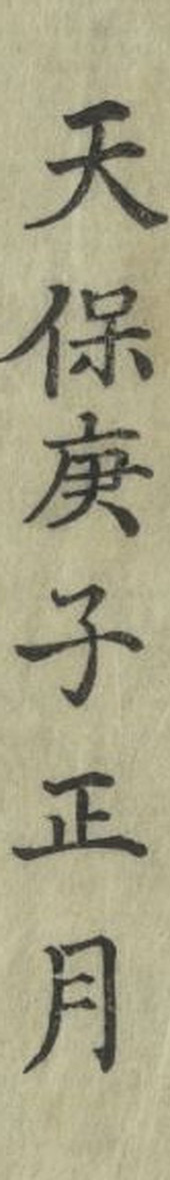天保庚子正月
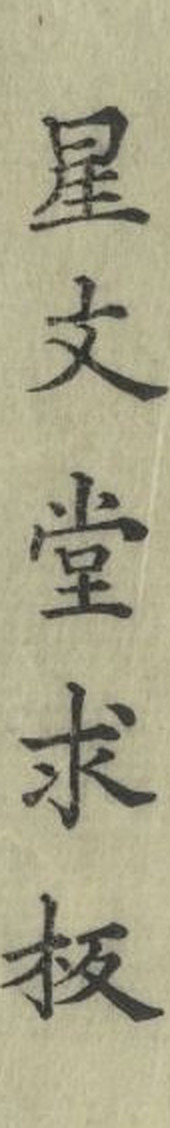星文堂求板
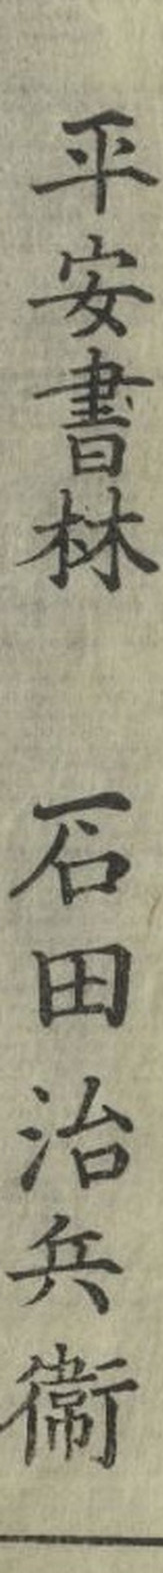平安書林石田治兵衛
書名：中山伝信録 巻六
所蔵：University of the Ryukyus Library
